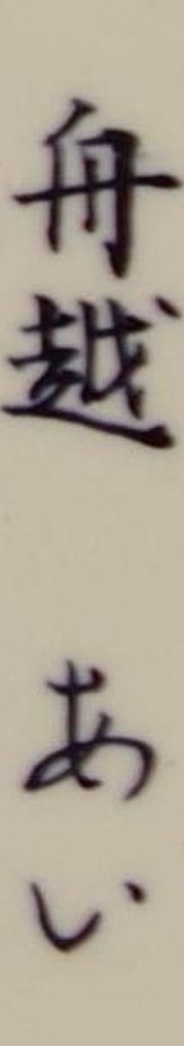舟越あい
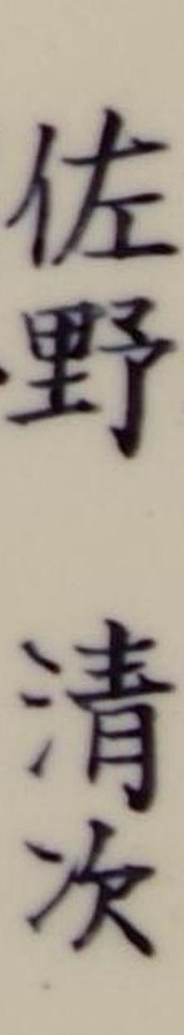佐野清次
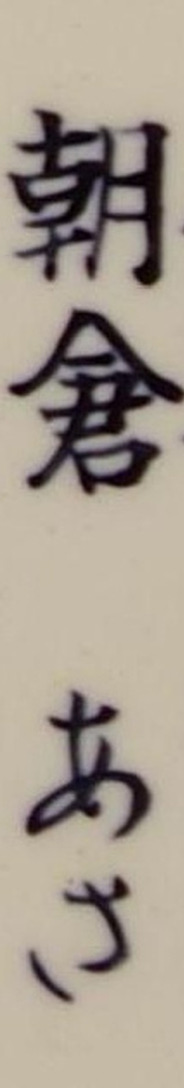朝倉あさ
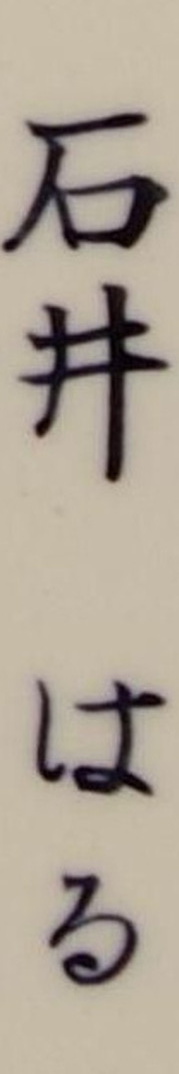石井はる
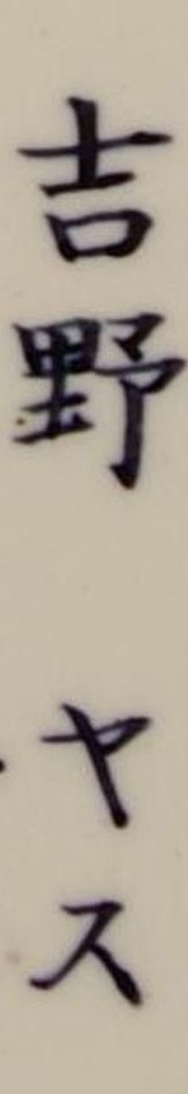吉野ヤス
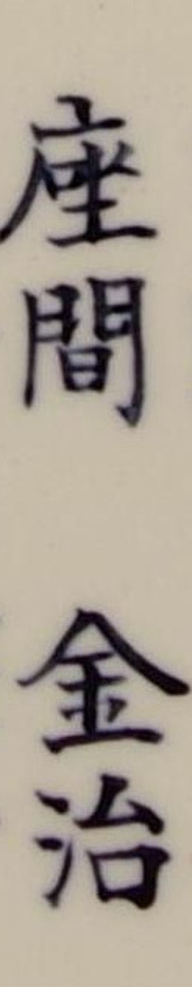座間金治
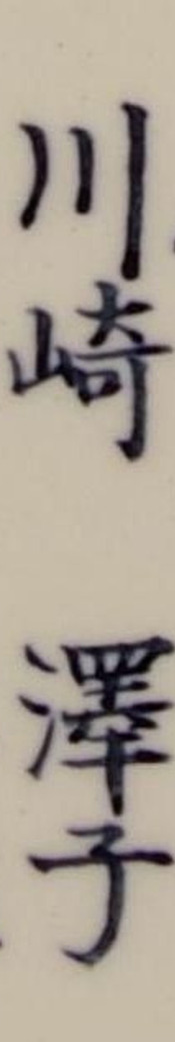川崎澤子
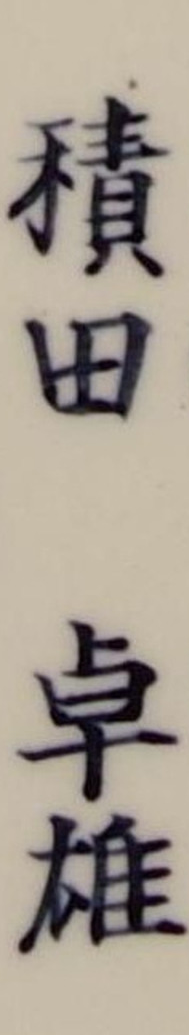積田卓雄
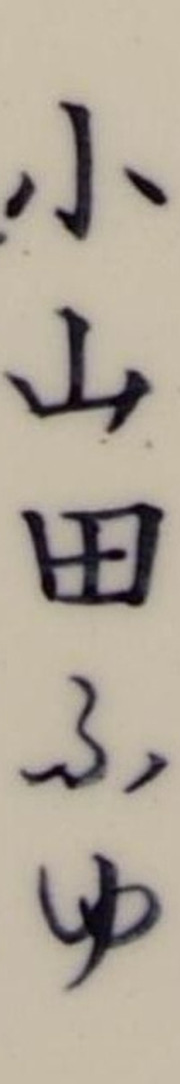小山田ふゆ
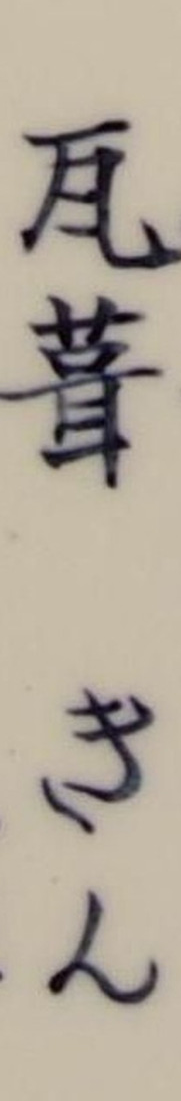瓦葺きん
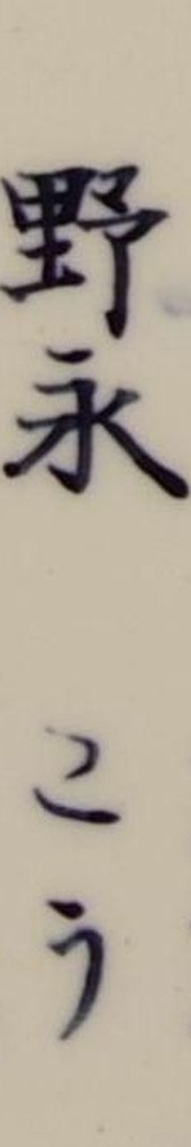野永こう
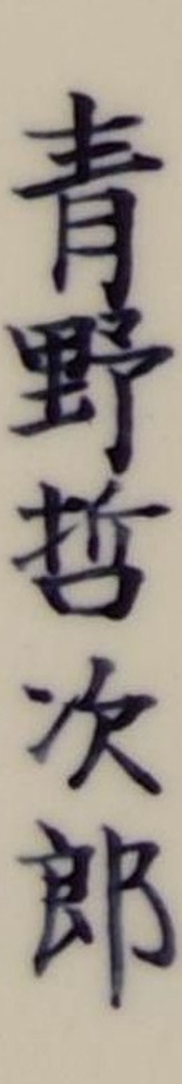青野哲次郎
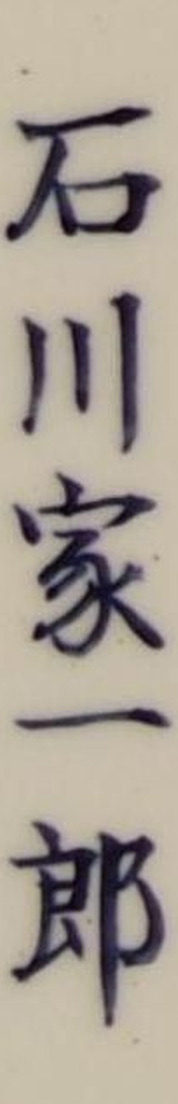石川家一郎
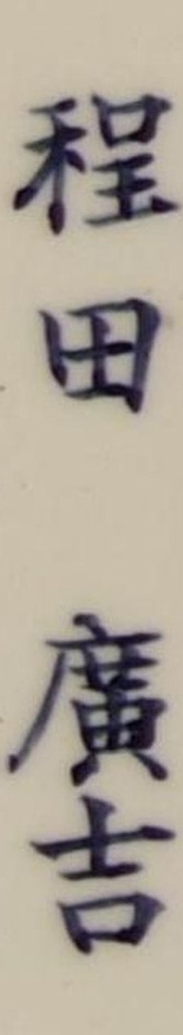程田広吉

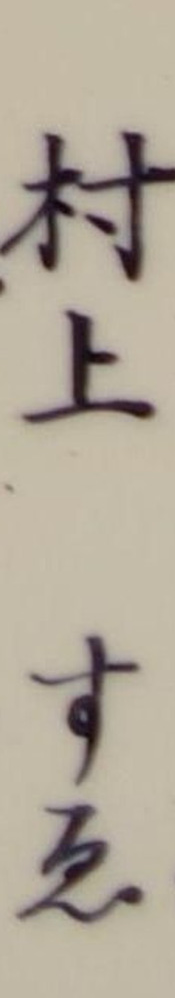村上すゑ
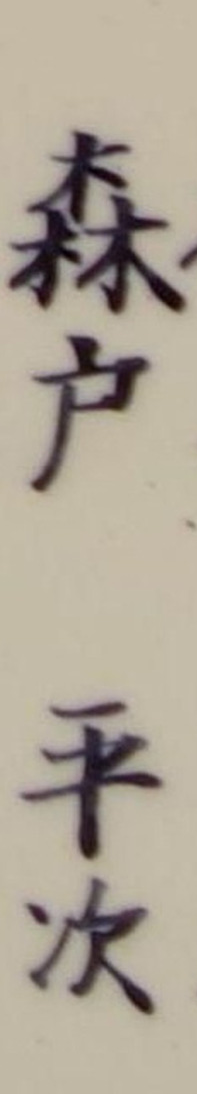森戸平次
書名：M~S
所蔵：高野山金剛峯寺
